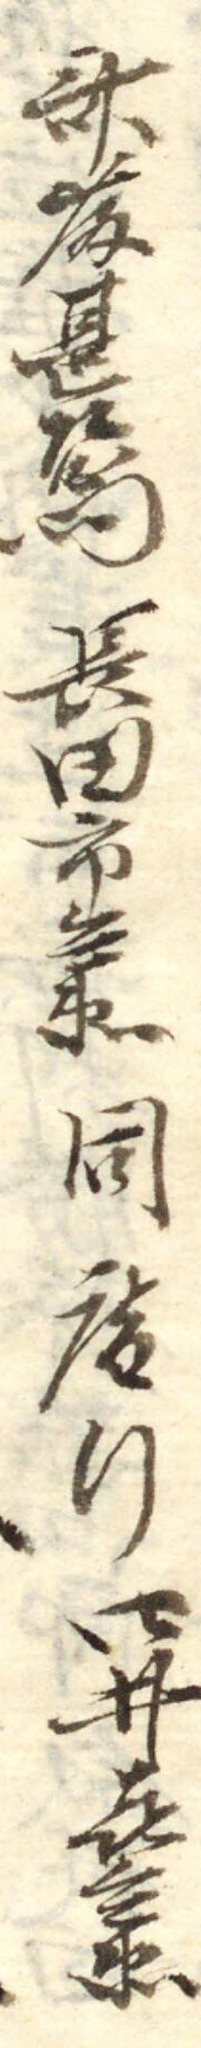斎藤甚左衛門長田市兵衛同廣行四井喜兵衛
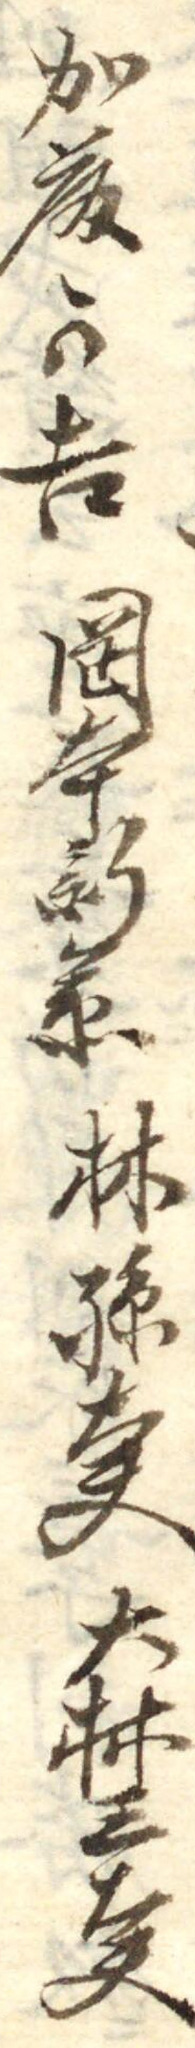加藤可吉岡本新兵衛林孫太夫大林三太夫
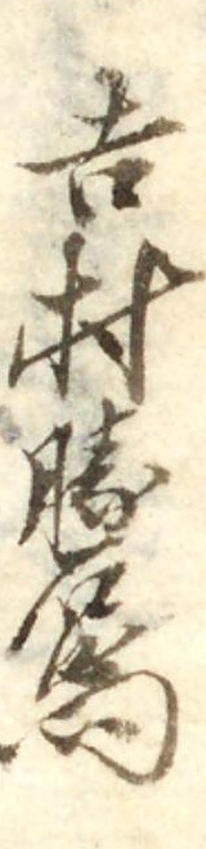吉村勝右衛門
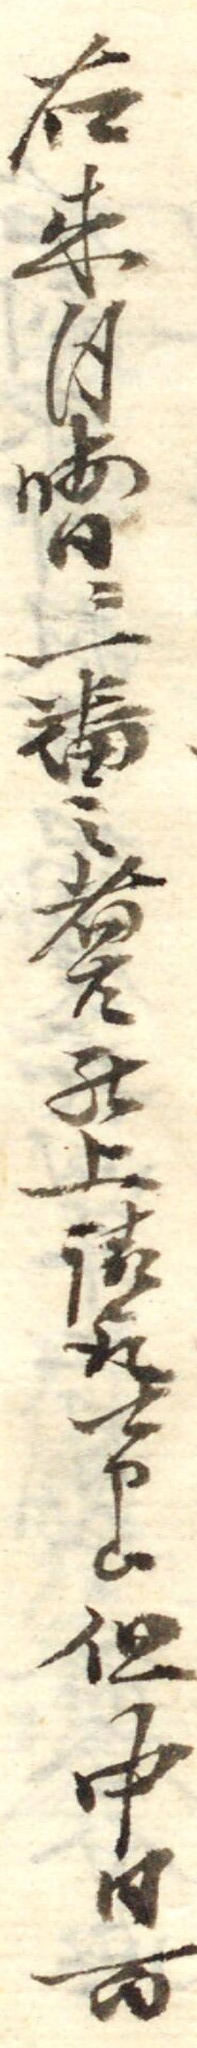右来月晦日に一番之者共罷上請取可申候但中日百
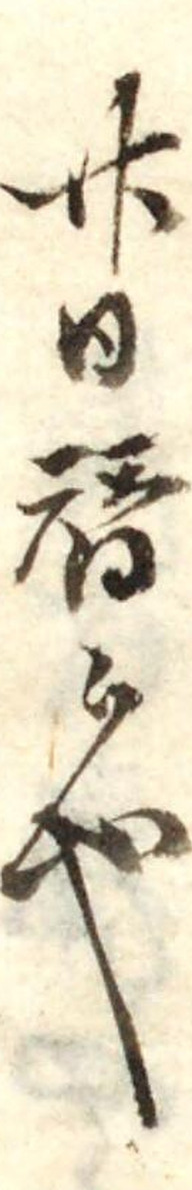廿日替候也
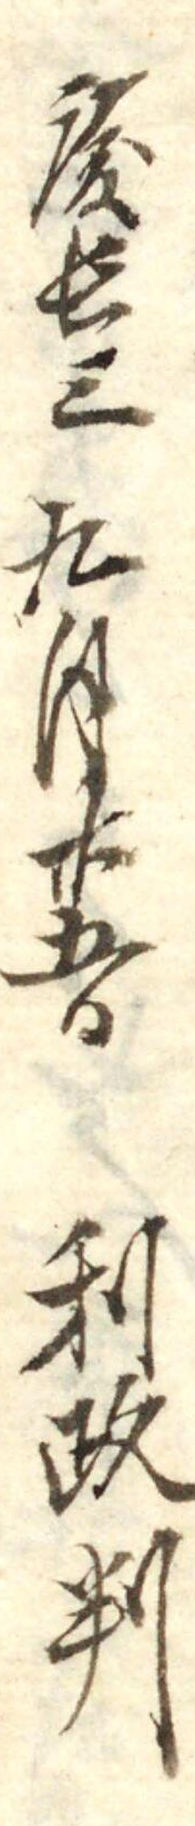慶長三九月廿五日利政判
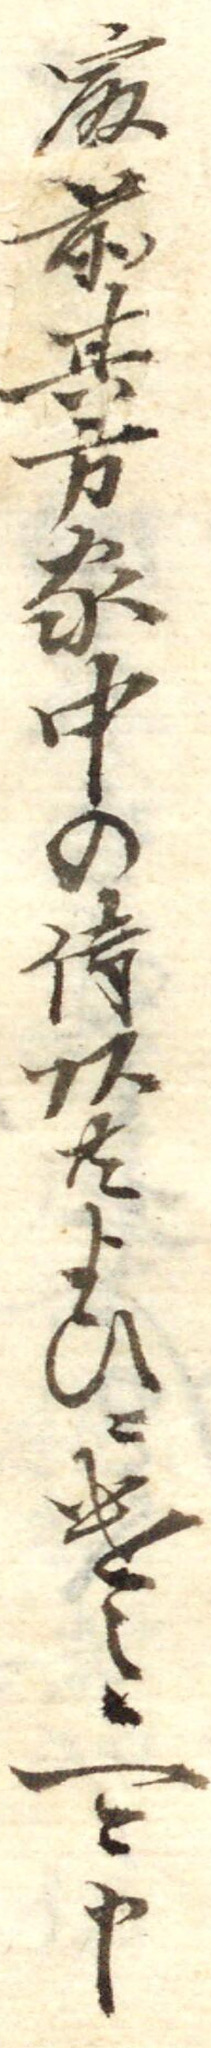最前其方家中の侍頭共よひに遣之候一と申
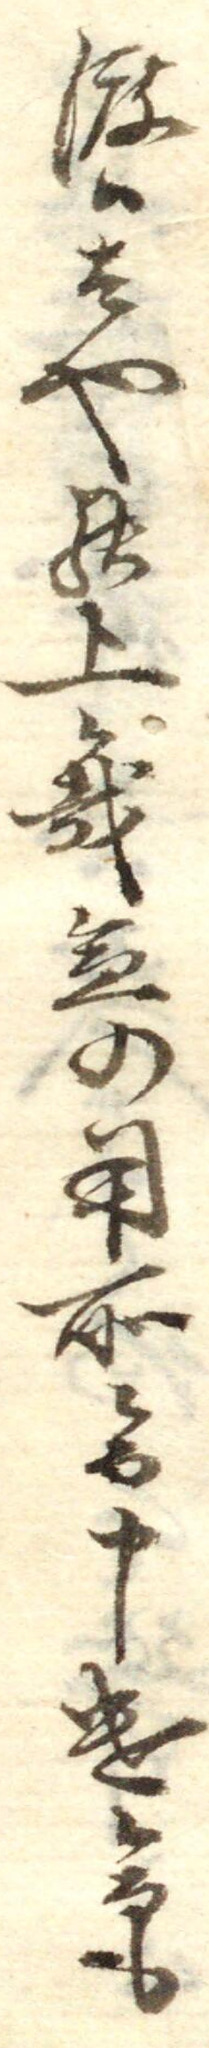渡候者也罷上候哉急の用所に而申遣候而も

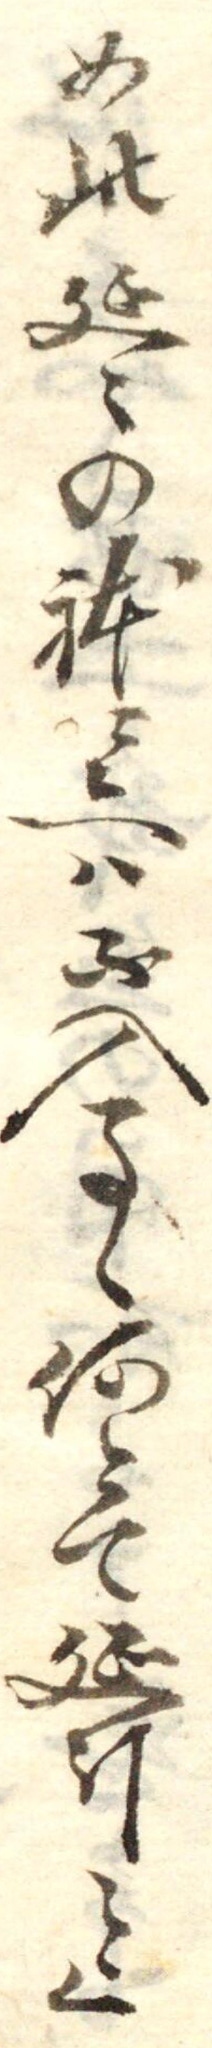如此延々の躰に候へはふ入事候何にて延引之上
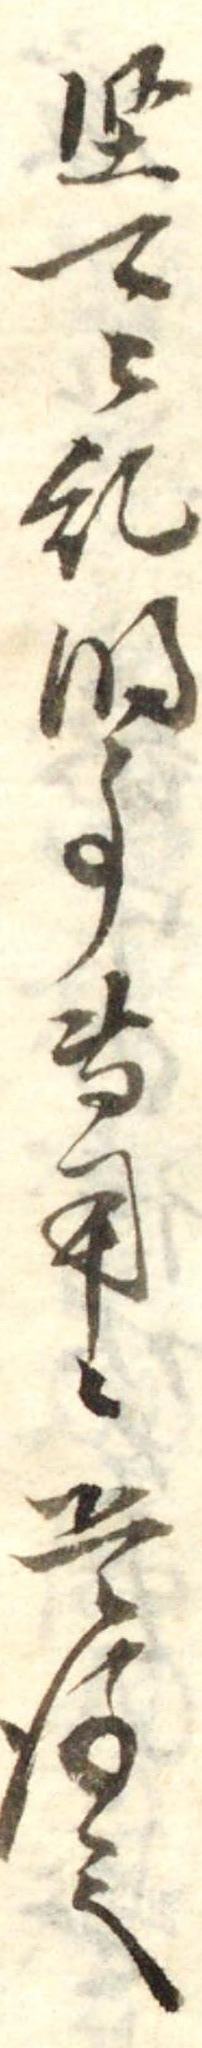堅可候糺明事専用候恐々謹言
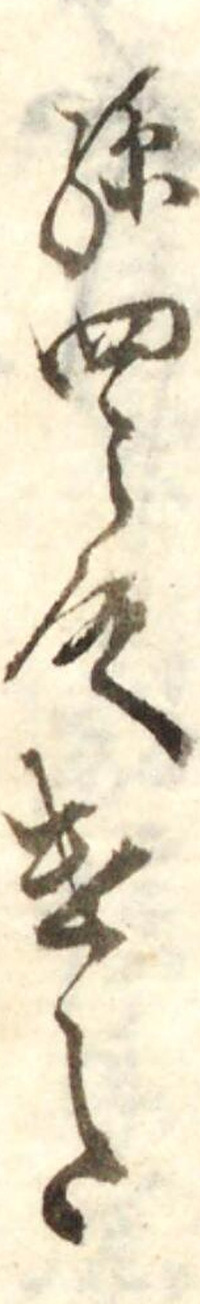孫四郎殿遣し候
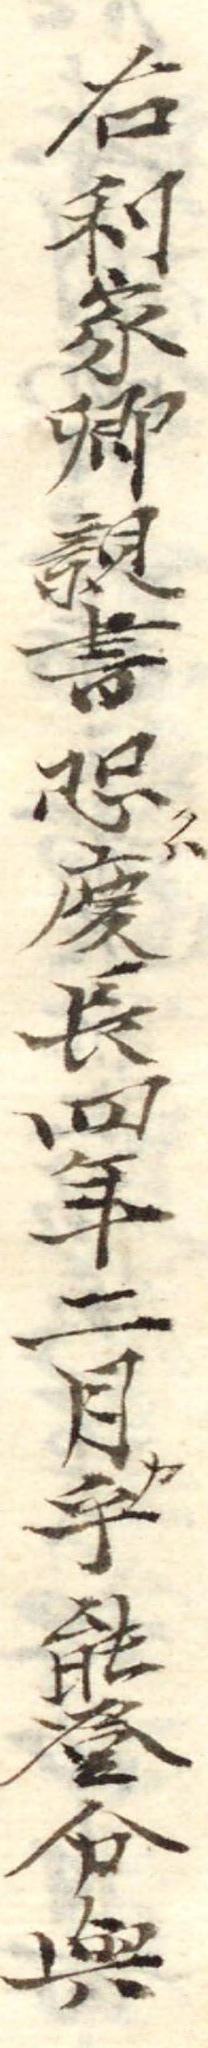右利家卿親書恐くは慶長四年二月か乎能登分與
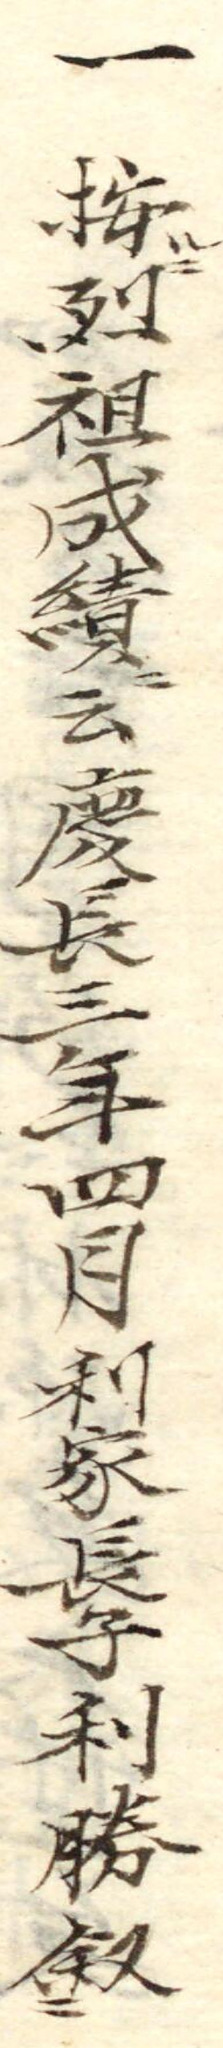一按るに烈祖成續に云慶長三年四月利家長子利勝叙
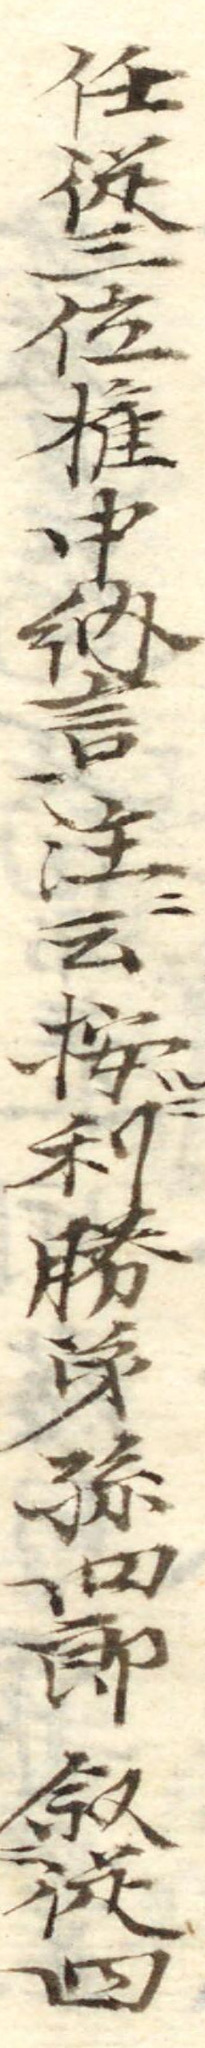任従三位権中納言注に云按るに利勝弟孫四郎叙従四
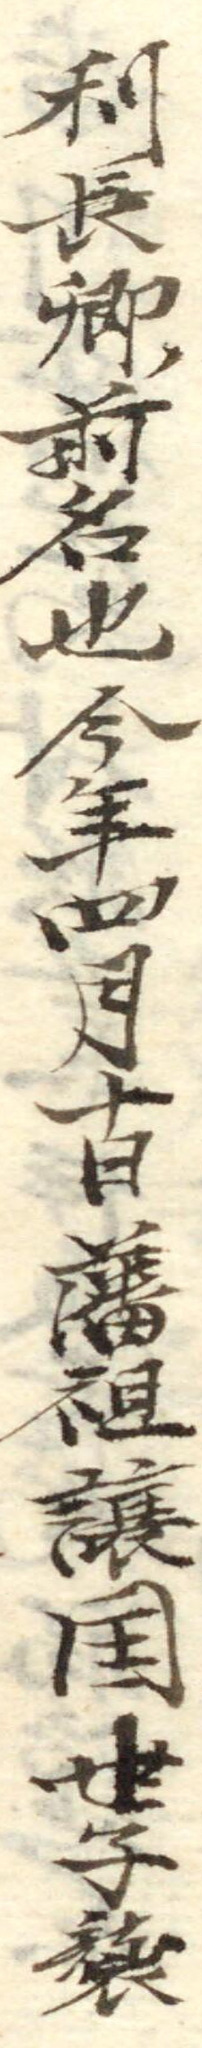利長卿の前名也今年四月十日藩祖譲国世子襲
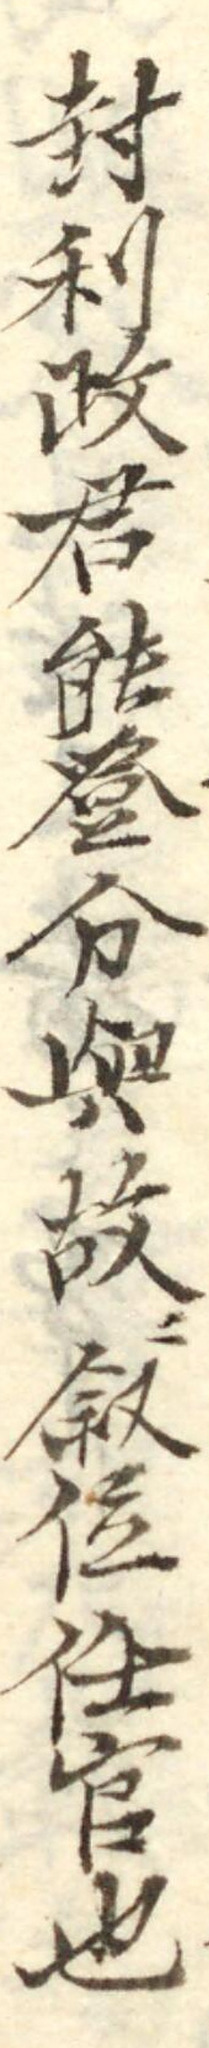封利政君能登分與故に叙位任官也
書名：前田家封国証書集録
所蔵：Ishikawa Prefectural Library
